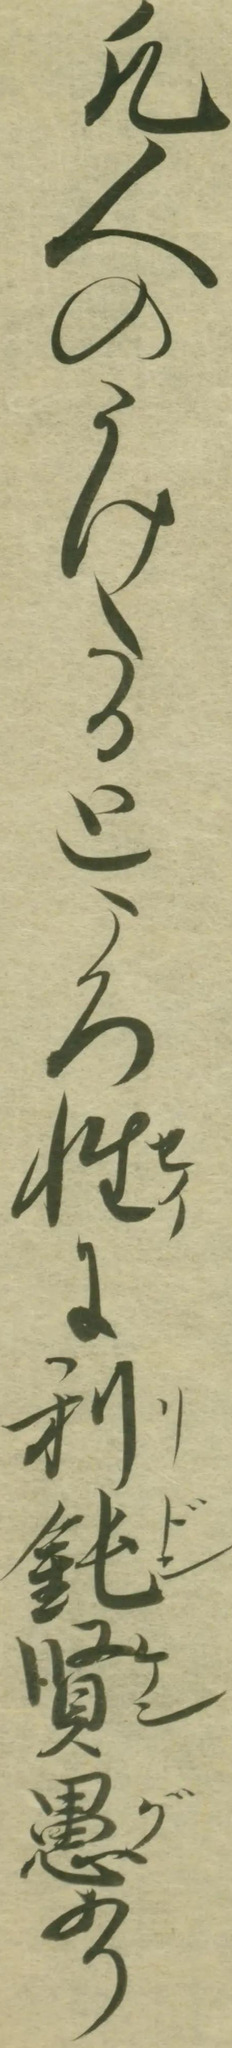凡人のうけたるところ性に利鈍賢愚あり
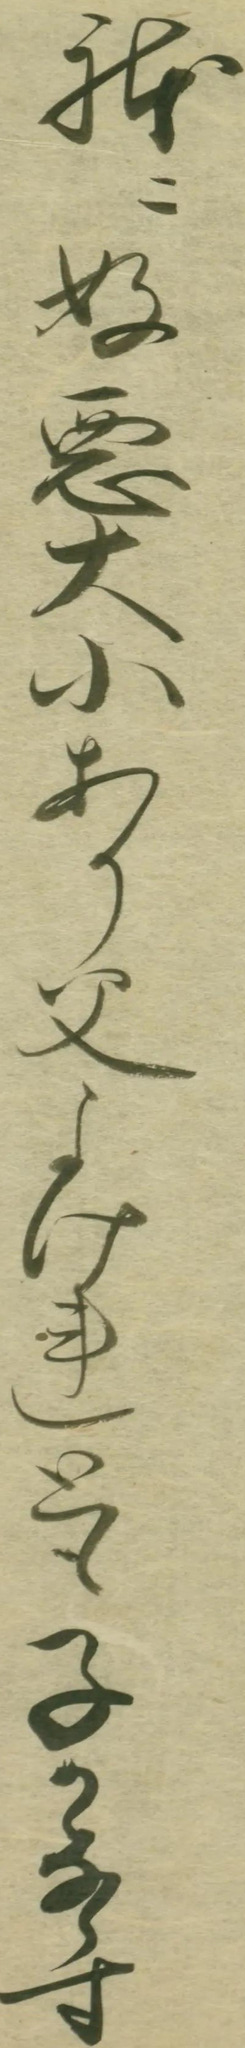体に好悪大小あり父よけれとも子かならす
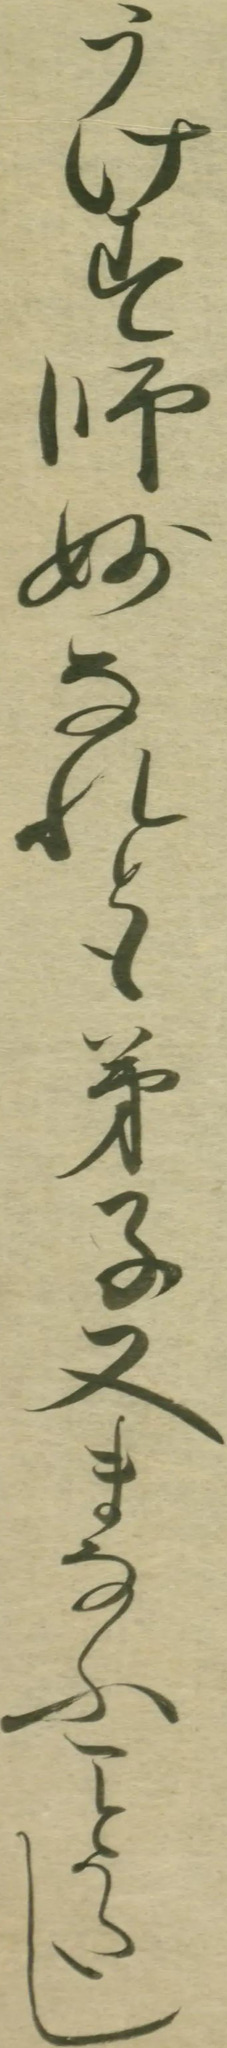うけす師妙なれとも弟子又まなふことかたし
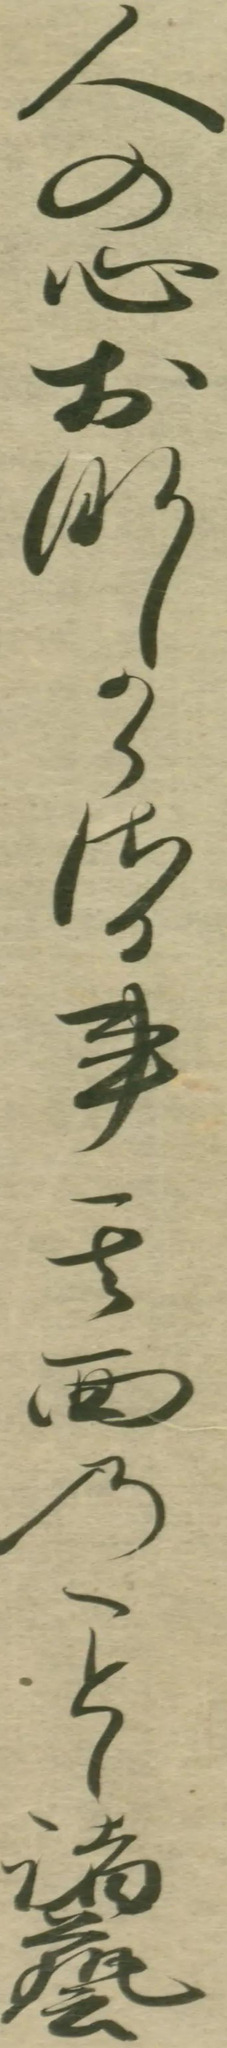人の心おなしからさる事其面のことし諸芸

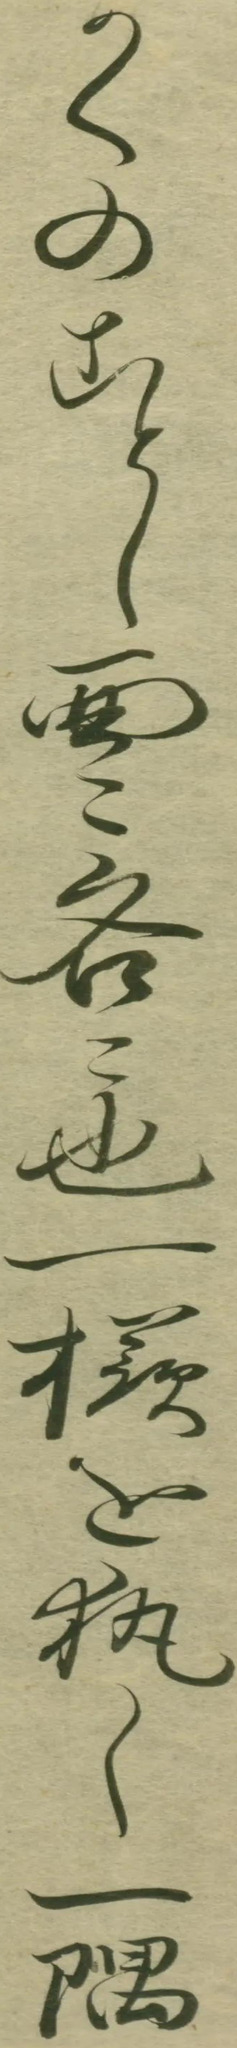かくのことし面々各々也一様を執く一隅
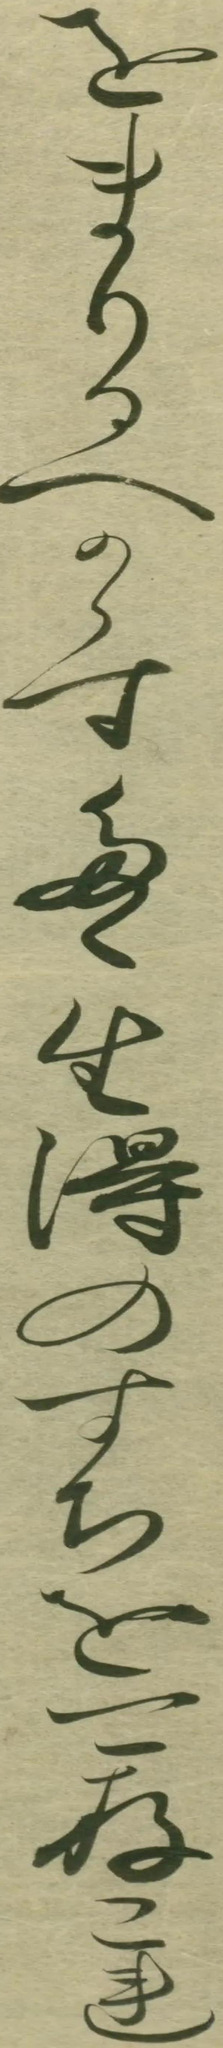をまりるへからす多々生得のすちを可存これ
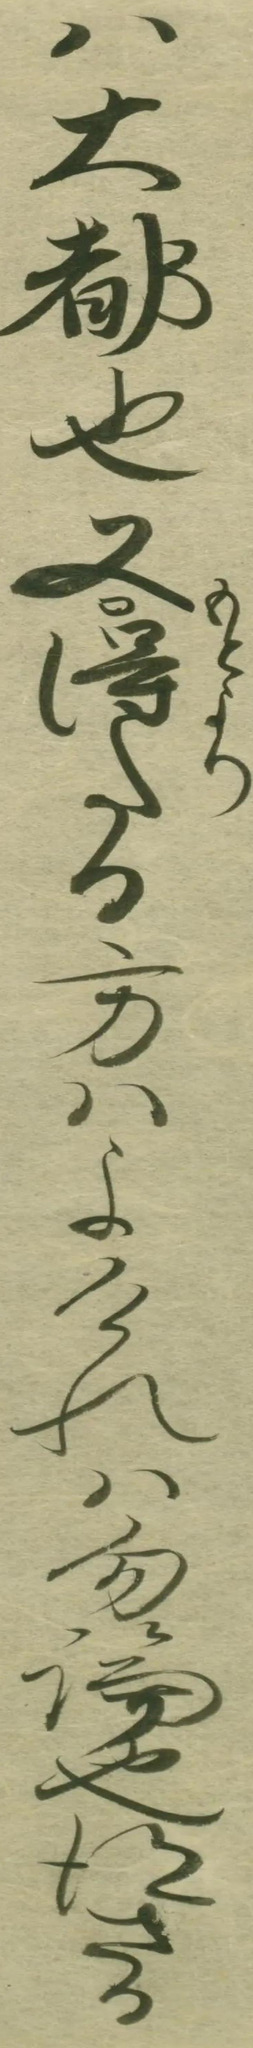は大都也又◦得たる方はよけれは勿論也得さる
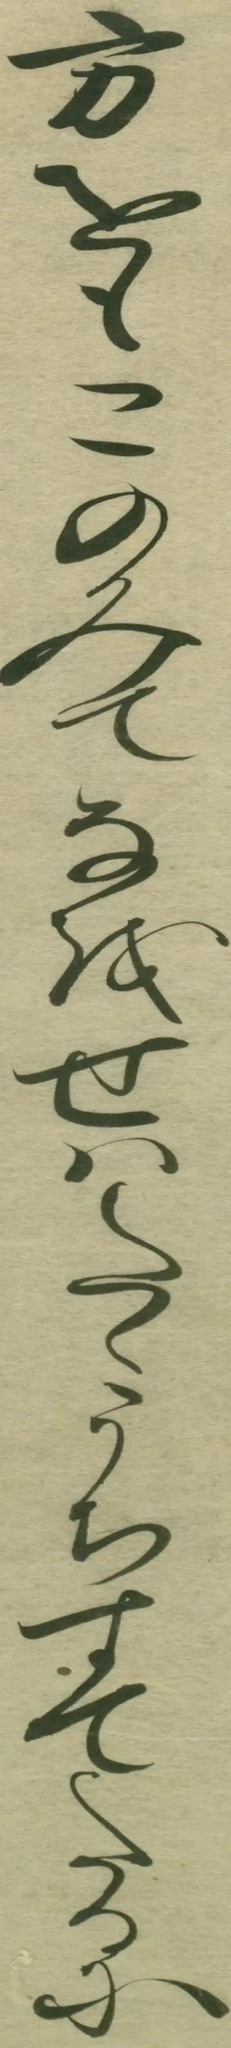方をもこのみてなをせはたゝうちすてたるに
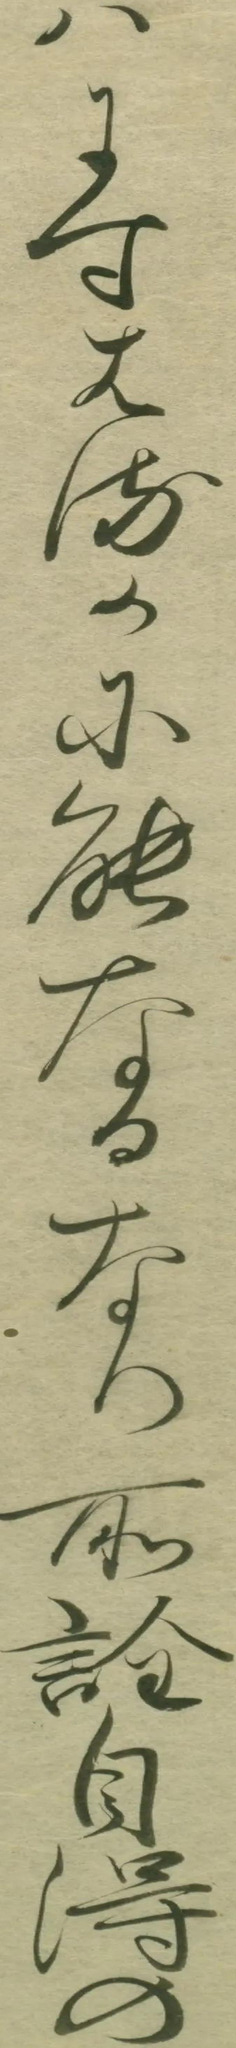はにすはるかに能なるなり所詮自得の
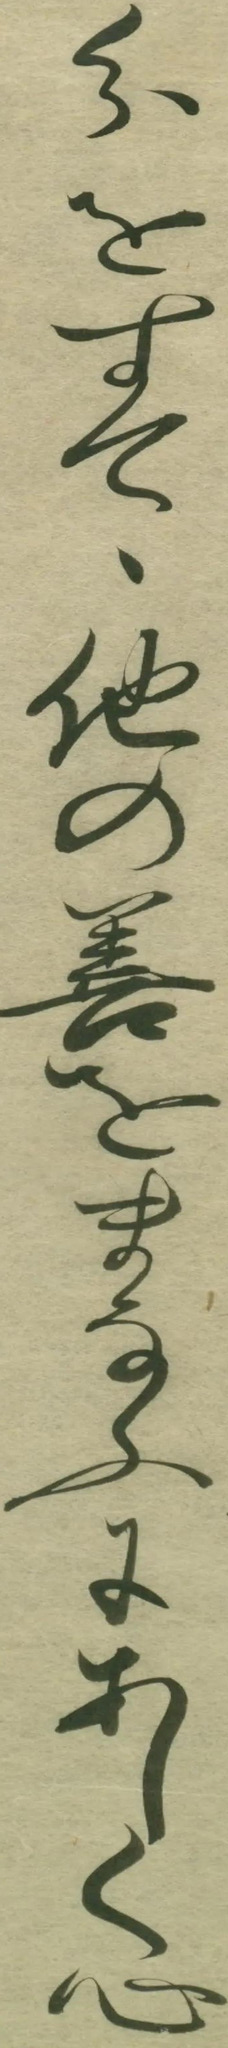分をすてゝ他の善をまなふにあしく心
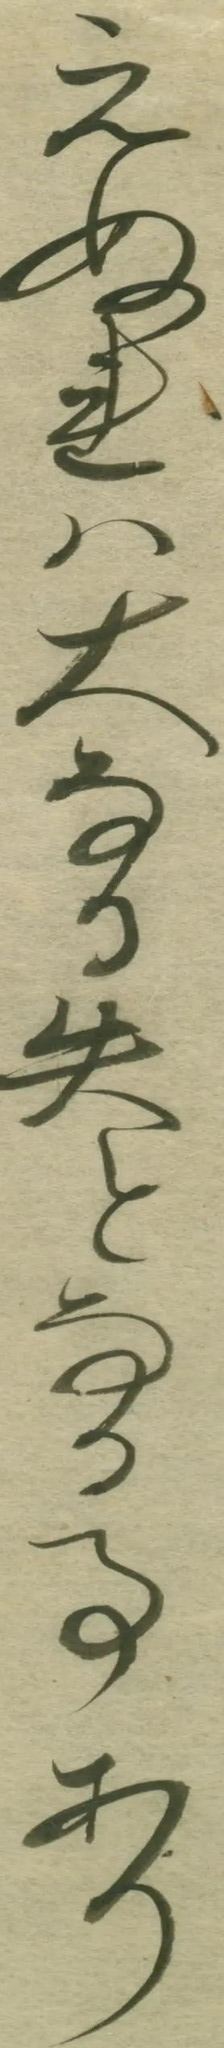えぬれは大なる失となる事あり
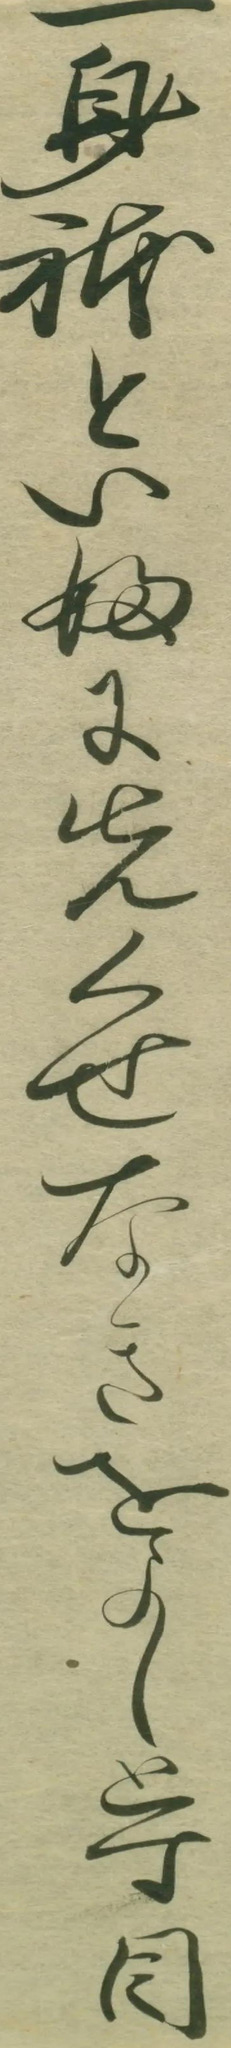一身体といふに先くせなきをよしとす目
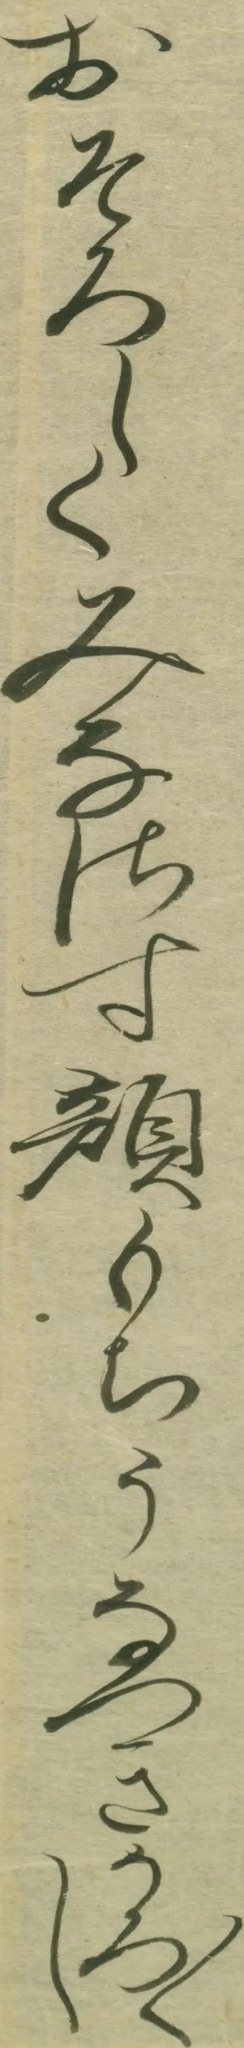おそろしくみなさす顔もちうなつきかろ〳〵し
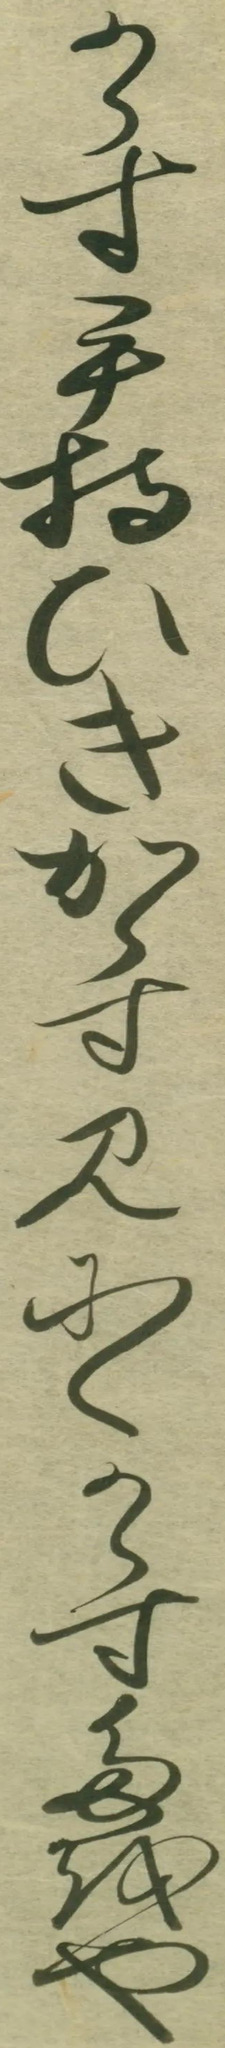からす手持ひきからすみにくからすたをや
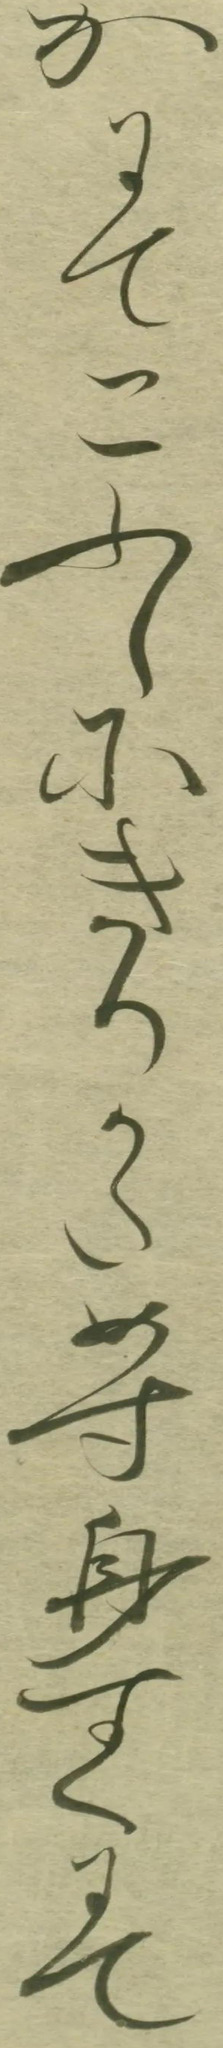かにてこふしにきりかためす身すくにて
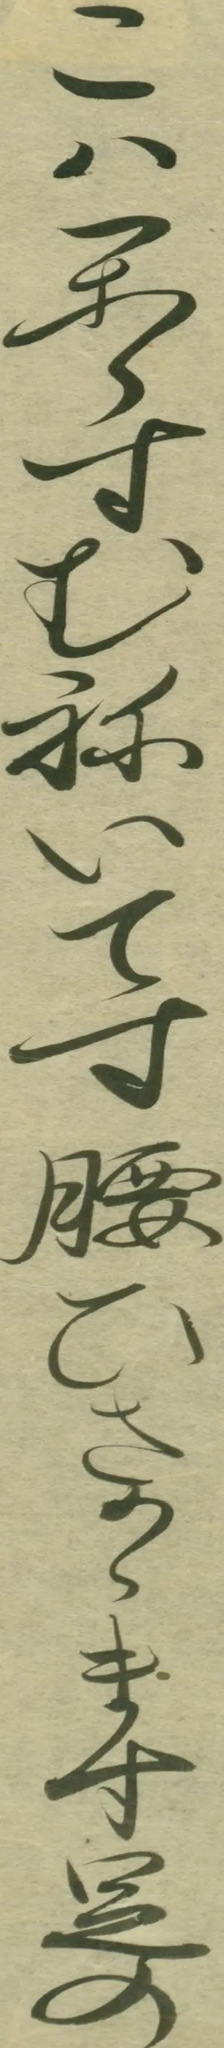こはからすむねいてす腰ひさかゝます足の
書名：蹴鞠之条々大概
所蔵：国立国会図書館 National Diet Library, JAPAN
